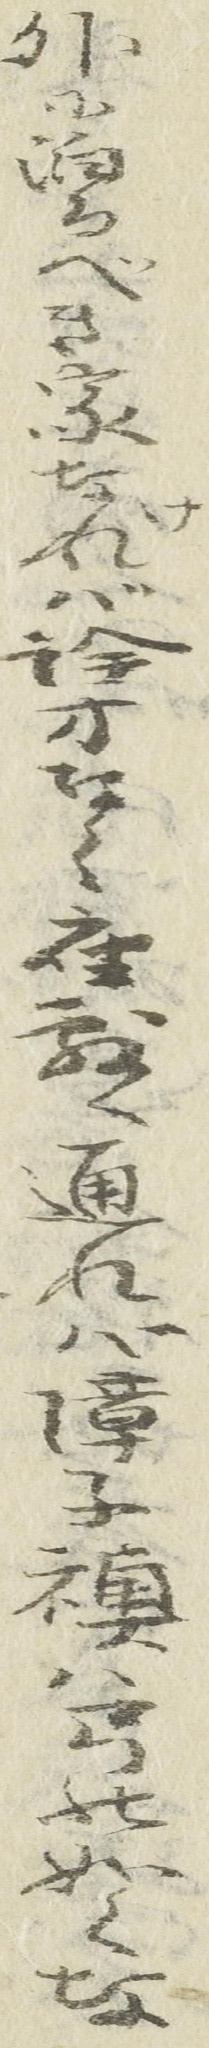外に泊るべき家なけれバ詮方なく座敷へ通れバ障子襖ハ弓の如くな
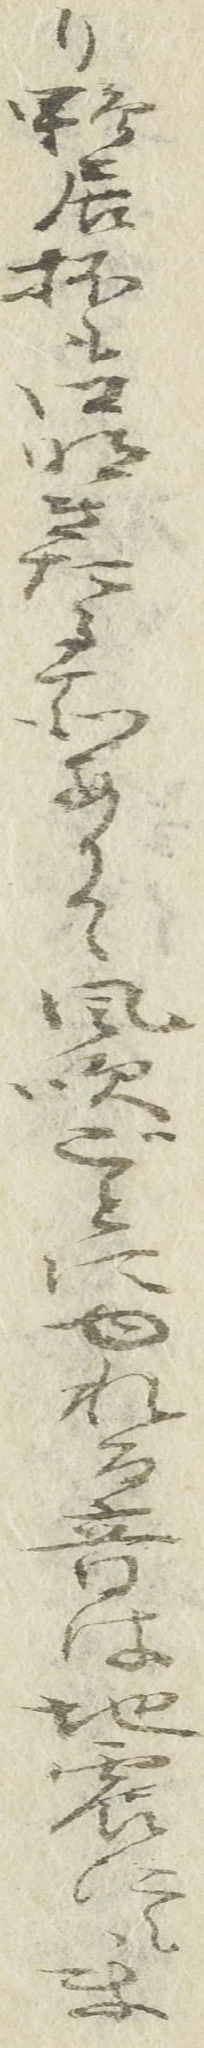り鴨居抔も口明きたる所ありて風吹ごとにゆれる音は地震にもま
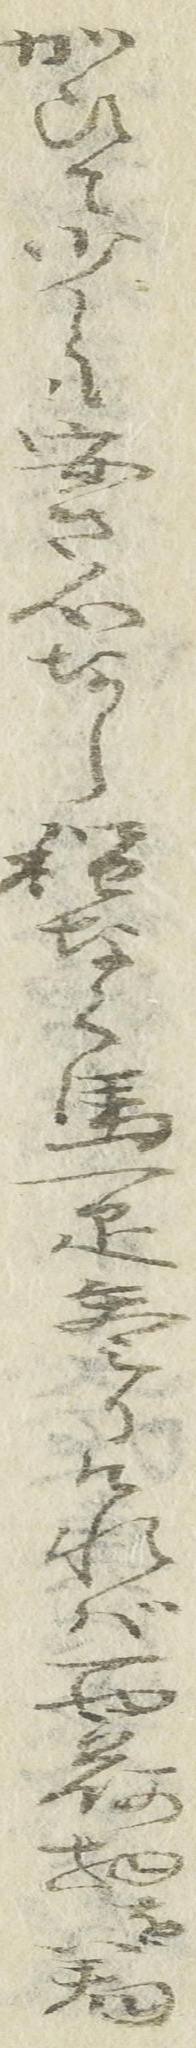かひて少しも安き心なし程なく馬一疋参りけれバ西荷物を着
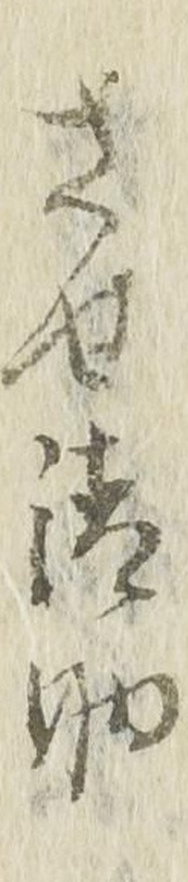させ御助
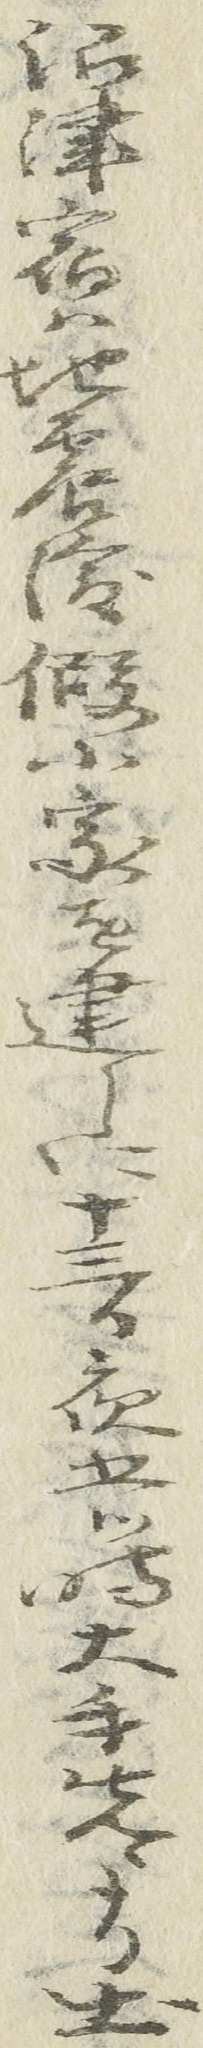沼津宿ハ地震後假に小家を建しに十三日夜五ツ時大手先より出
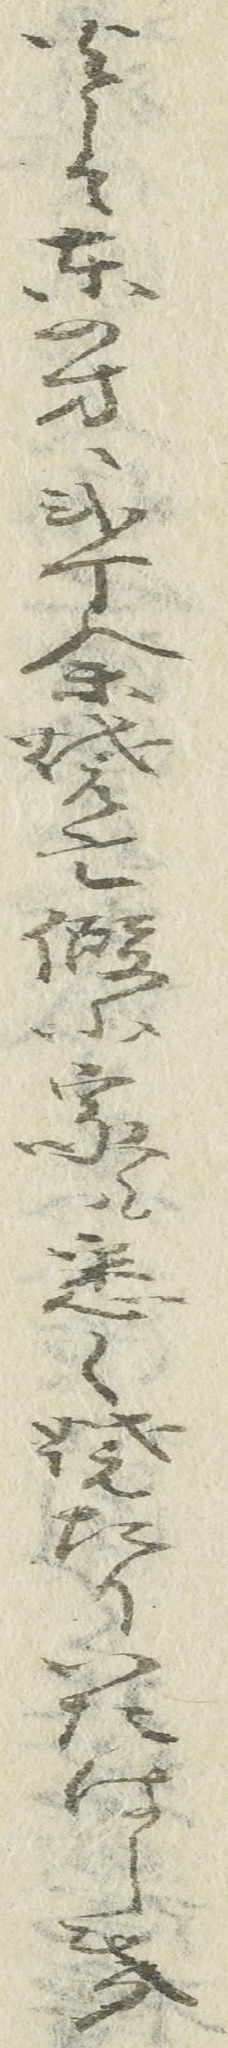火して東の方へ弐丁余焼亡假小家も悉く焼たりいたはしき
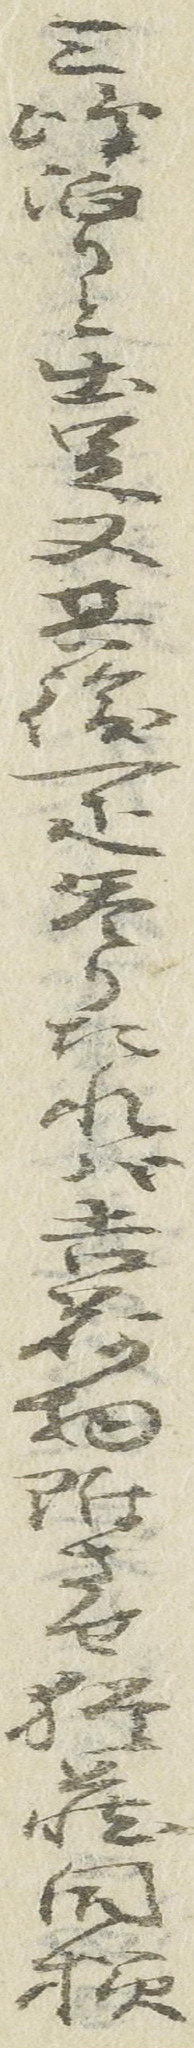三嶋泊りと出足又其後一疋参りたれバ吉荷物附けさせ猶蔵同様
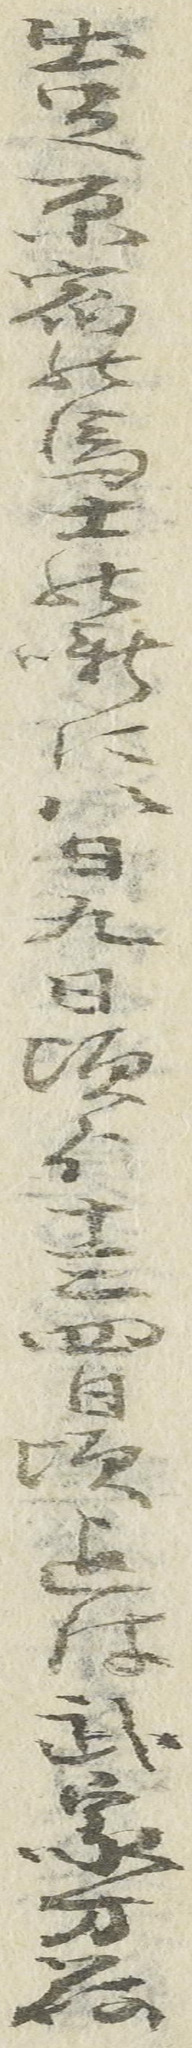出足原宿の馬士の噺に八日九日頃ゟ十三四日頃迄は武家方荷
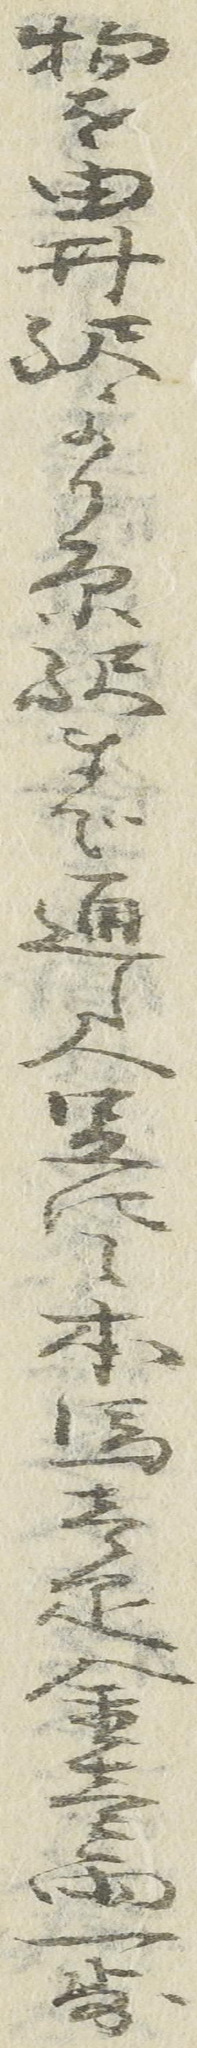物を由井駅より原駅まで通し人足にて本馬壱疋金壱両一歩
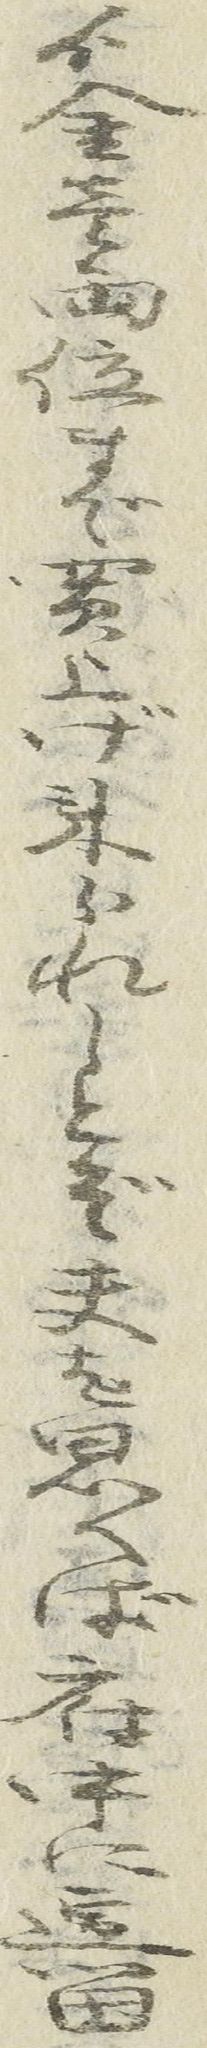ゟ金壱両位まで買上げ来られしとぞ夫を思へば府中に逗留

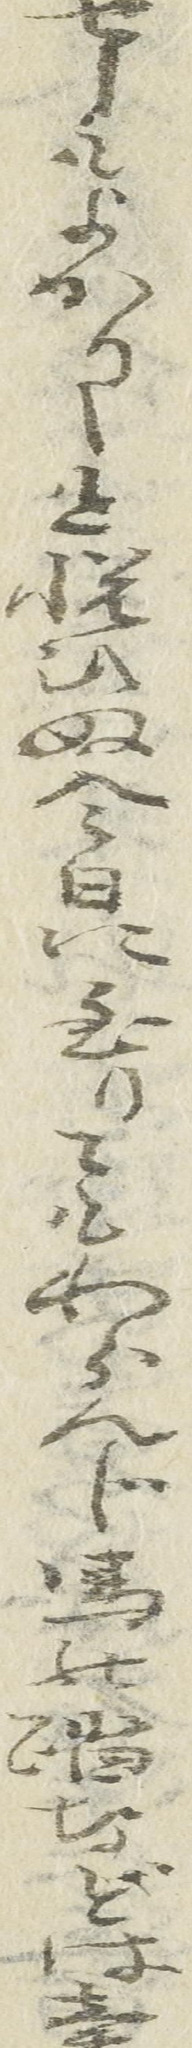せしもよかりしと悦ひぬ今日に至りてもわらんじ馬の踏などは売
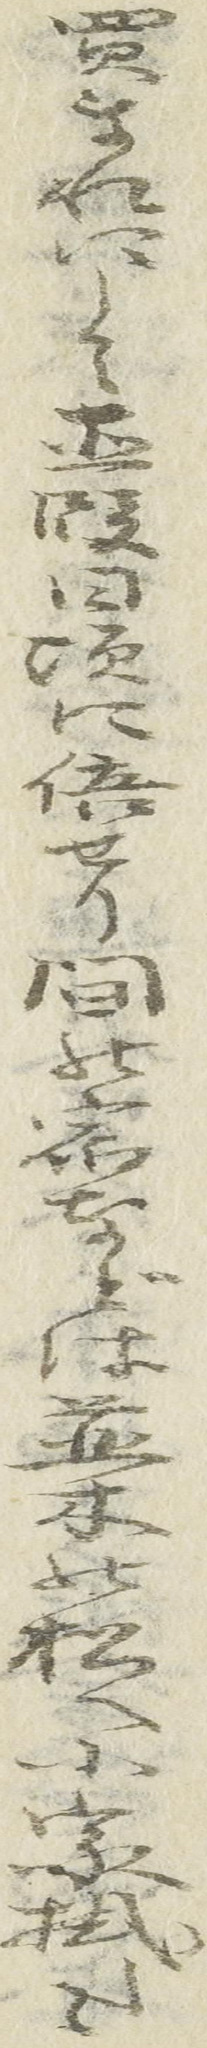買まれにして直段日頃に倍せり間の宿などは並木の松へ小家掛して
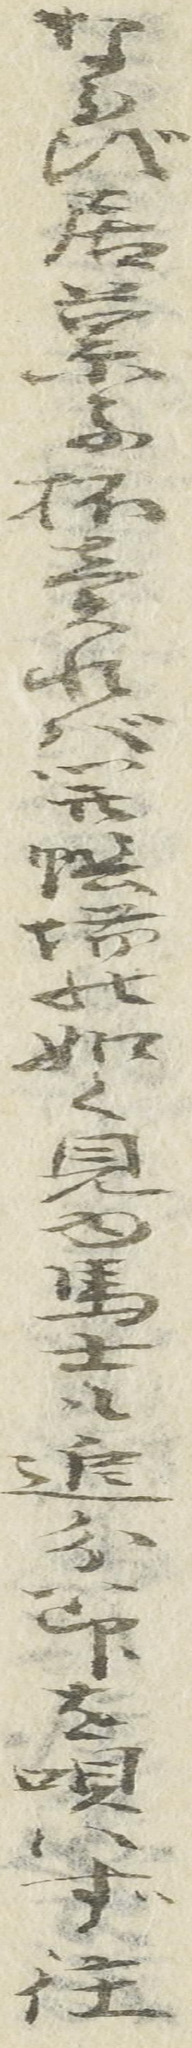ならび居菓子抔売れバ開帳場の如く見ゆ馬士も追分節を唄ハず往
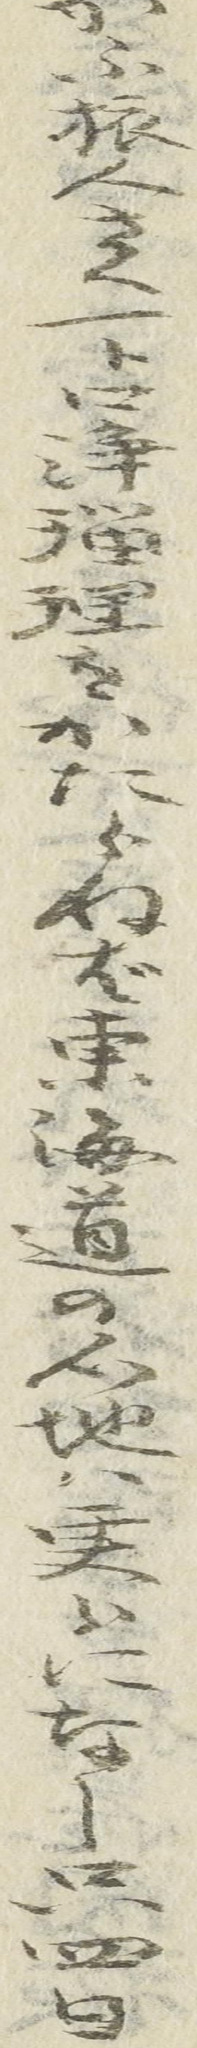かふ旅人さへ一ト口浄瑠理をかたらねば東海道の心地ハ更らになし只四日
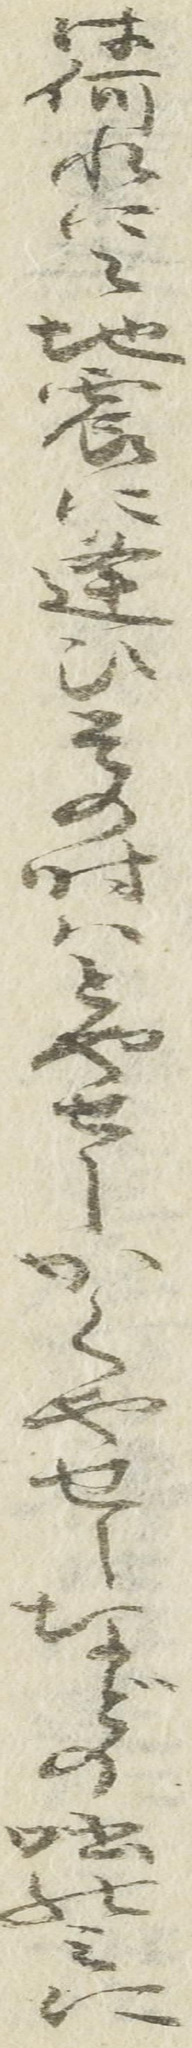は何れにて地震に逢ひその時ハとやせしかくやせしなどの咄のみに
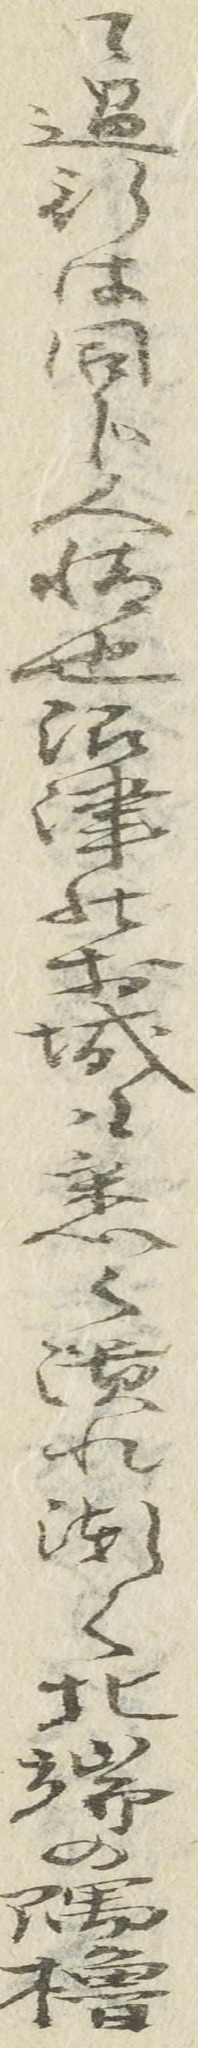て過行は同じ人情也沼津のお城も悉く潰れ漸く北端の隅櫓
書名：地震前兆集　全
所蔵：東京大学地震研究所図書室 Earthquake Research Institute Library, The University of Tokyo, JAPAN
